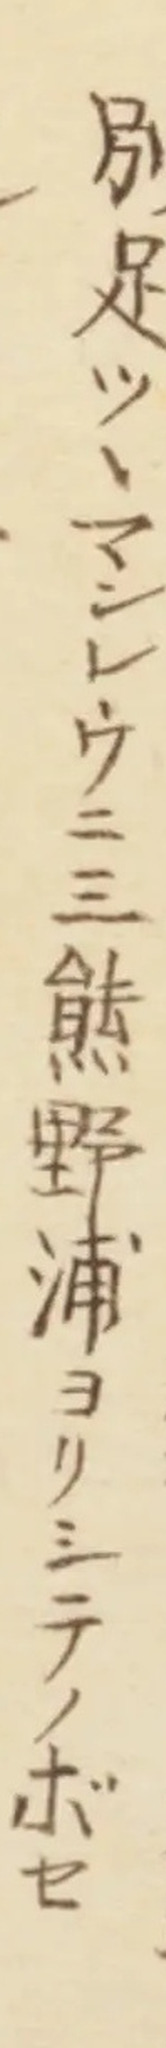別足ツヽマンレウニ三熊野浦ヨリシテノボセ
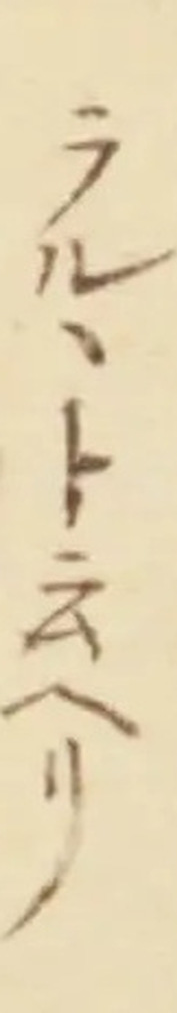フルヽト云ヘリ
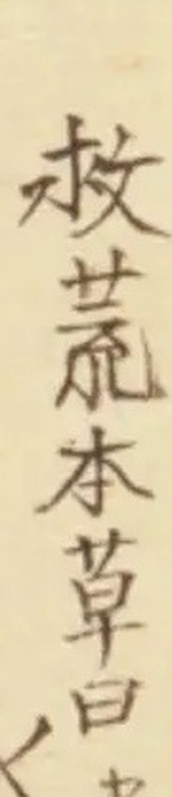救荒本草曰
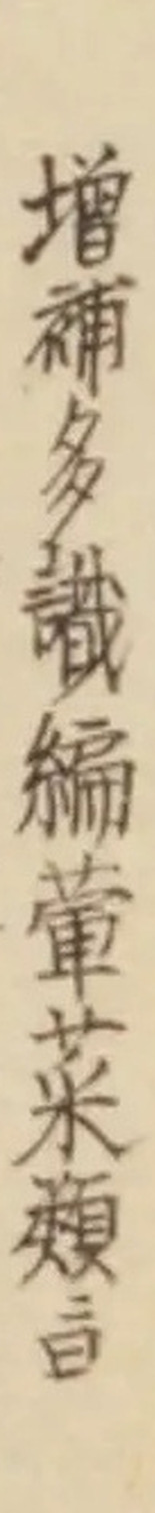増補多識編灌木葷菜類ニ曰
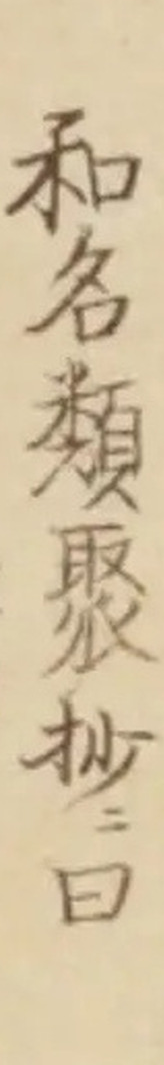和名類聚抄ニ曰

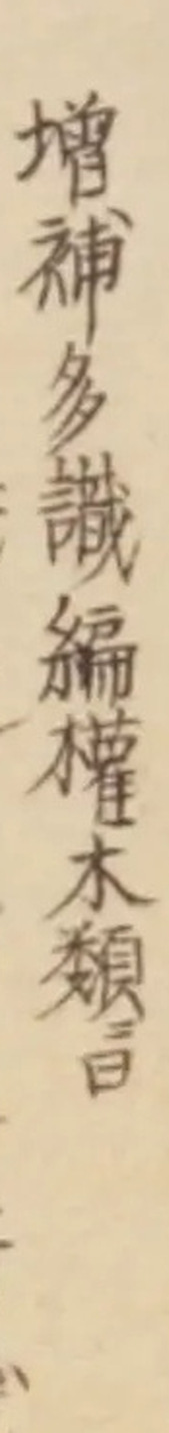増補多識編灌木類に曰
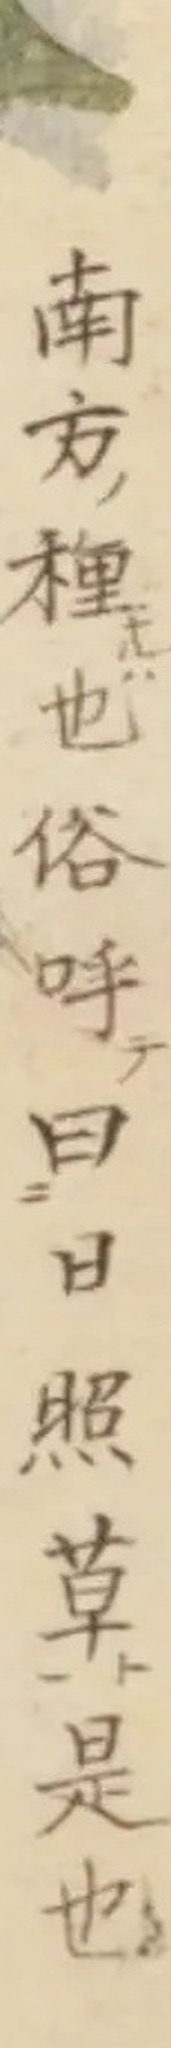南方ノ種ナルニ也俗呼テ曰ク日照草ト是也
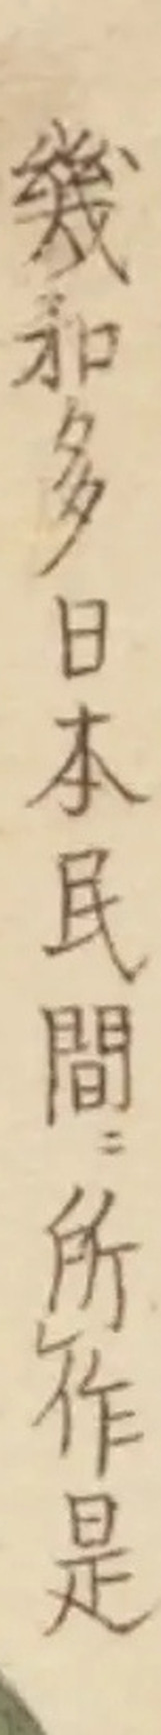幾和多日本民間所作是
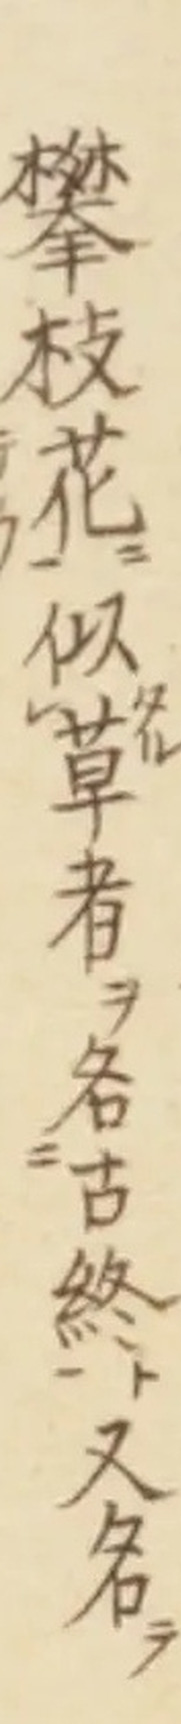欅枝花ニ似タル者ヲ名古終ト又名テ
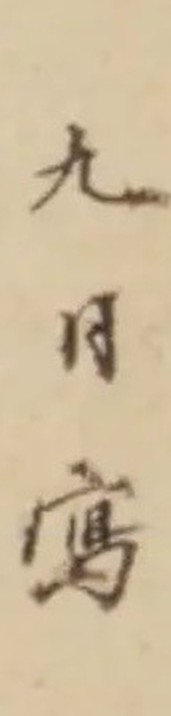九日寫

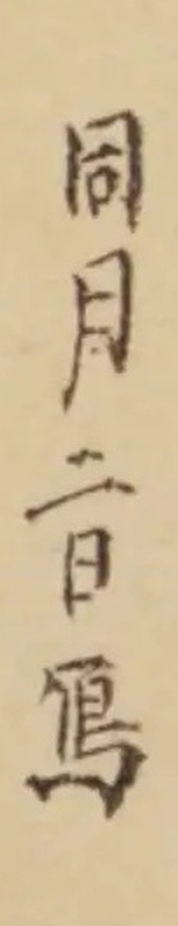同日二日寫

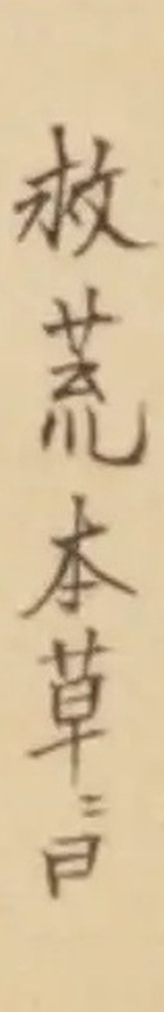救荒本草ニ曰
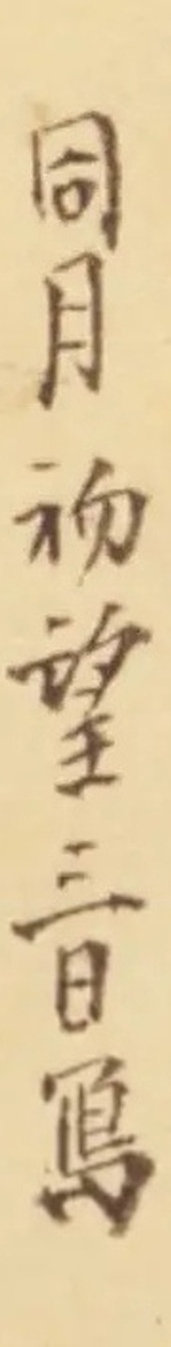同月初望三日寫
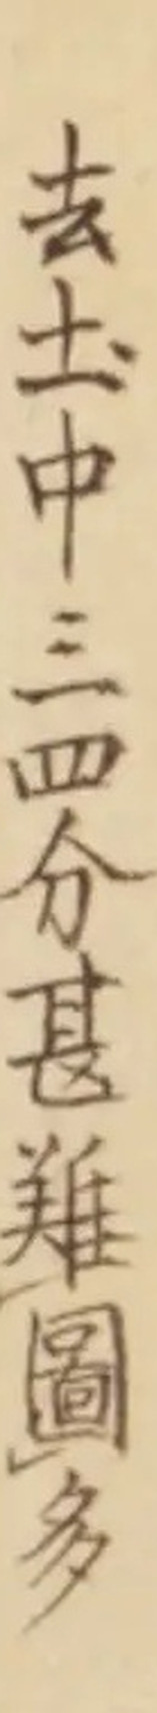去土中三四分甚難圖多
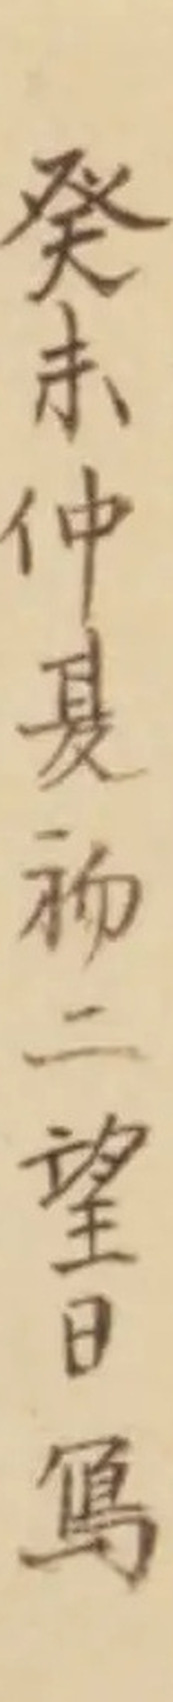癸未仲呂初二望日寫

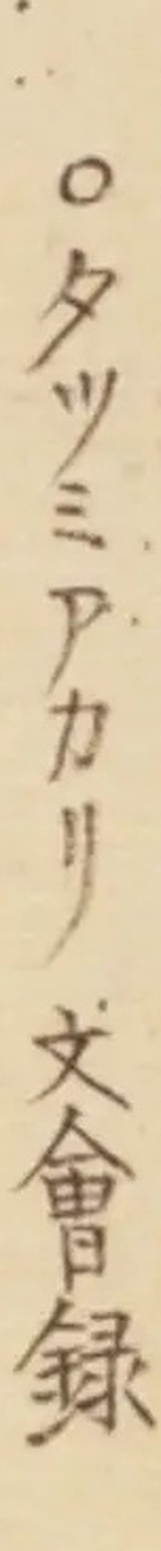〇タツミアカリ文會録
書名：梅園草木花譜夏之部. 1
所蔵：国立国会図書館 National Diet Library, JAPAN
